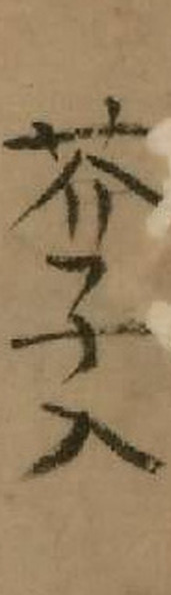芥子入
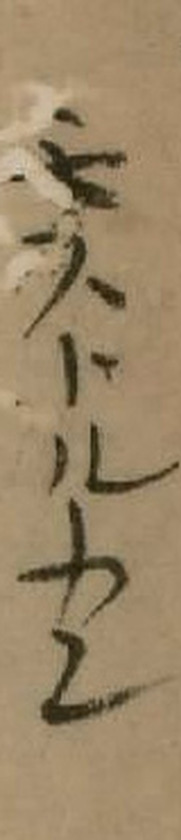モストルカン
